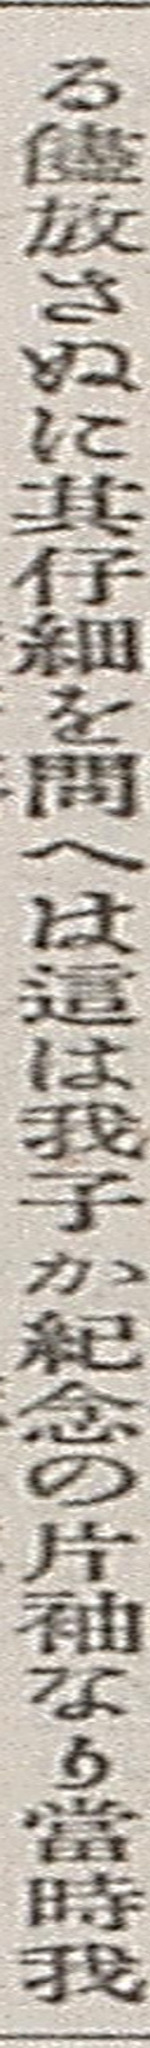る侭放さぬに其子細を問へは這は我子か紀念の片袖なり当時我
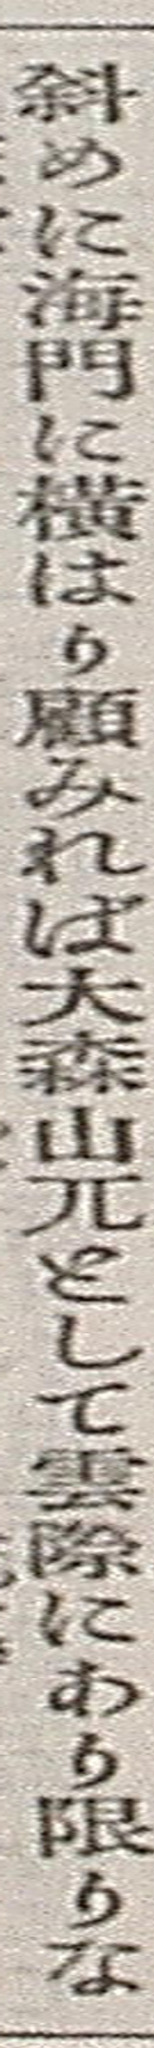斜めに海門に横はり顧みれば大森山兀として雲際にあり限りな
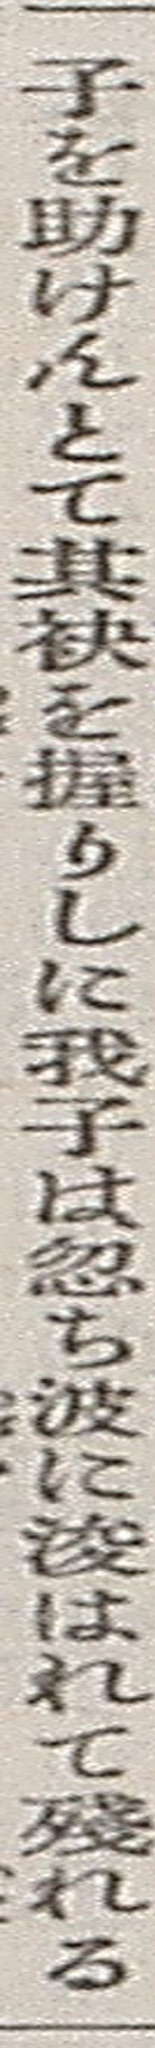子を助けんとて其袂を握りしに我子は忽ち波に浚はれて残れる
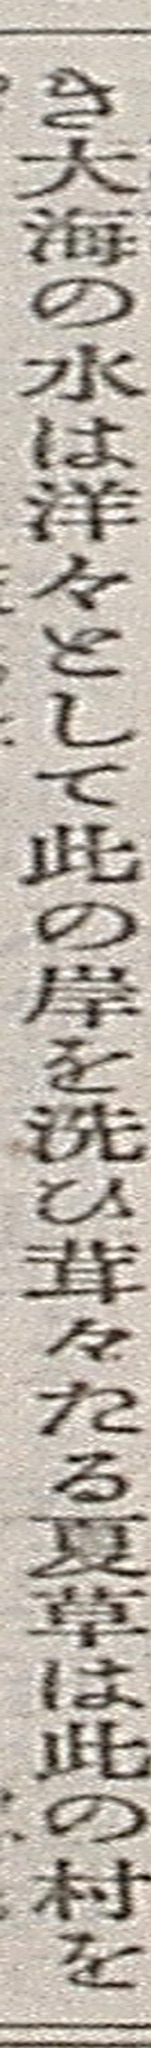き大海の水は洋々として此の岸を洗ひ茸々たる夏草は此の村を
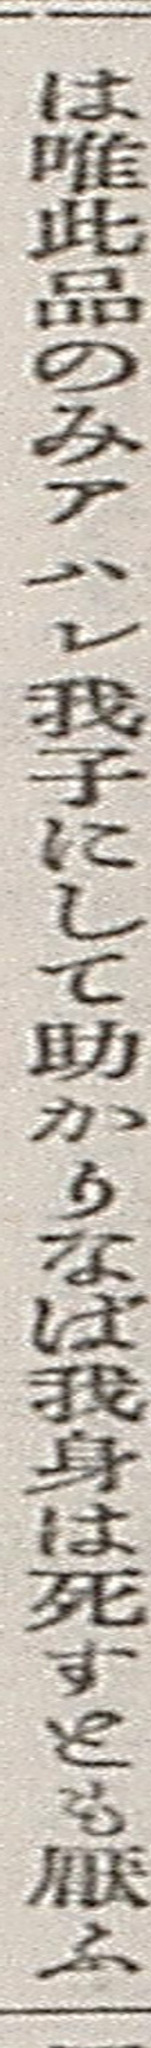は唯此品のみアハレ我子にして助かりなば我身は死すとも厭ふ
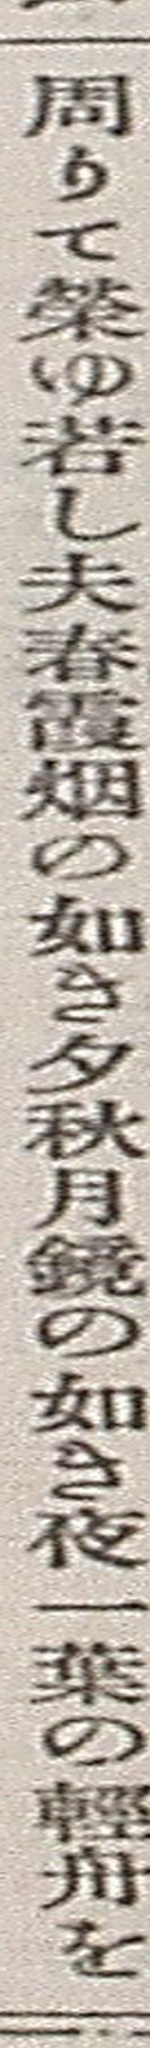周りて栄ゆ若し夫春霞烟の如き夕秋月鏡の如き夜一葉の軽舟を
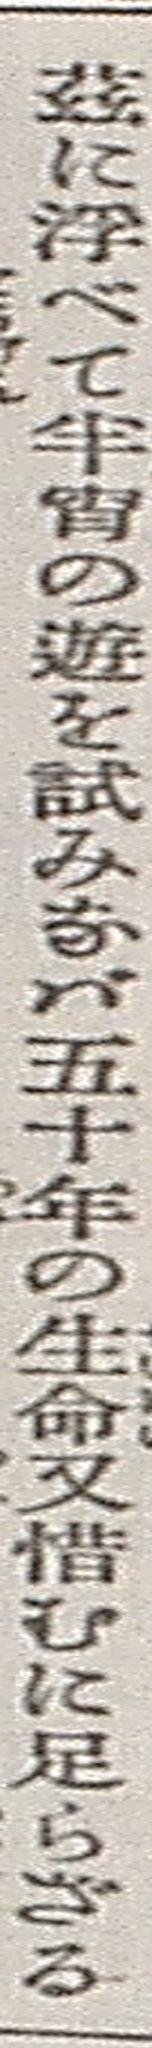茲に浮べて半宵の遊を試みなば五十年の生命又惜むに足らざる
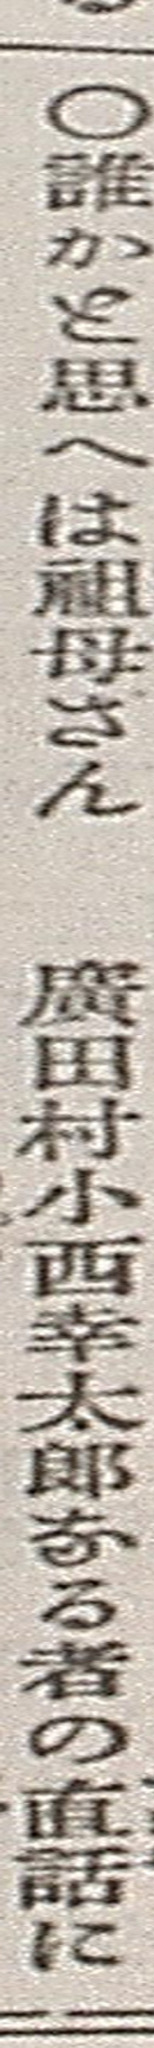○誰かと思へは祖母さん広田村小西幸太郎なる者の直話に
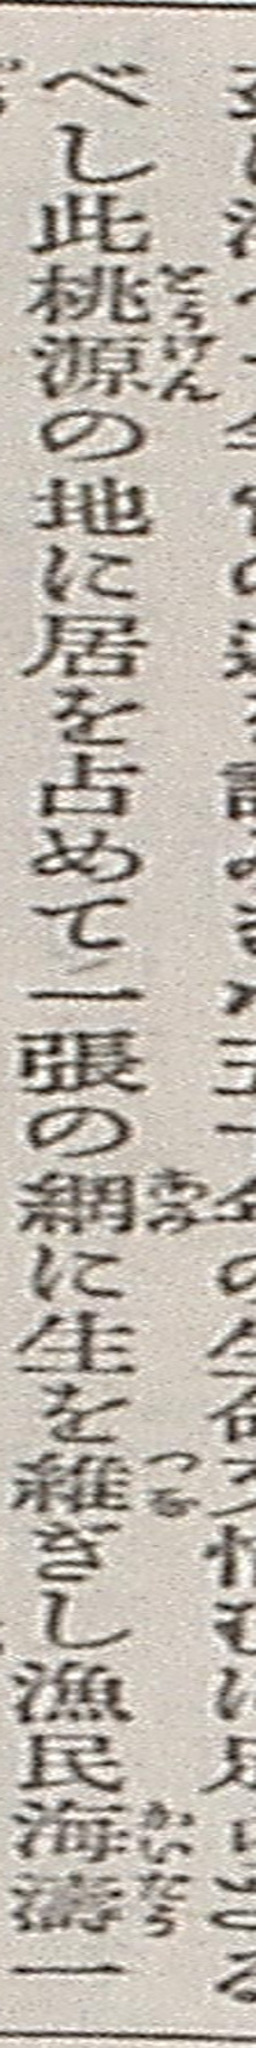べし此桃源の地に居を占めて一張の網に生を維ぎし漁民海濤一
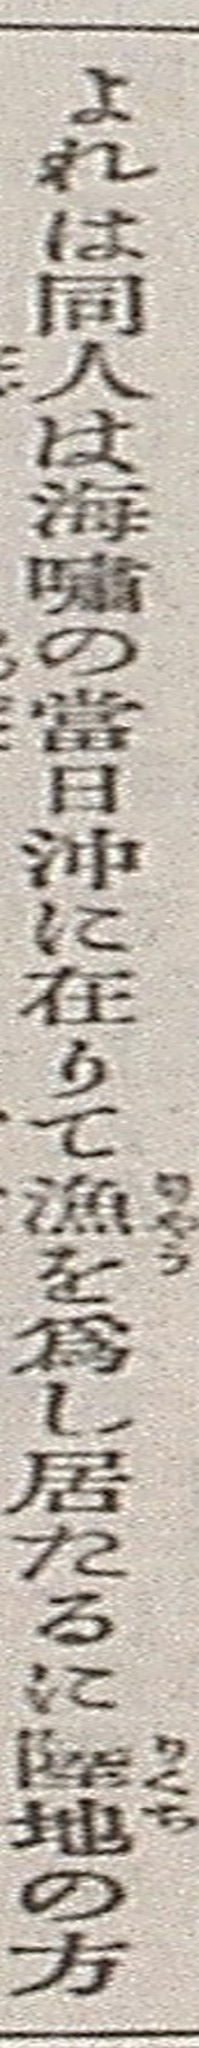よれは同人は海嘯の当日沖に在りて漁を為し居たるに陸地の方
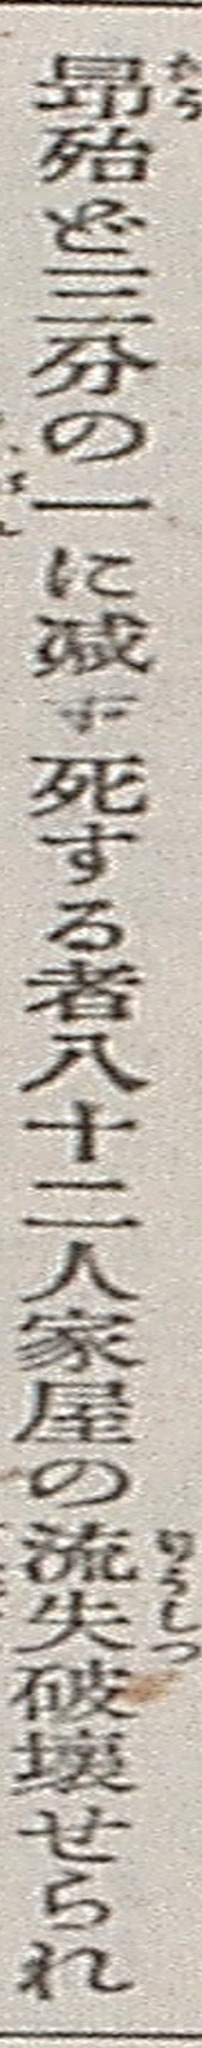昻殆ど三分の一に減ず死する者八十二人家屋の流失破壊せられ
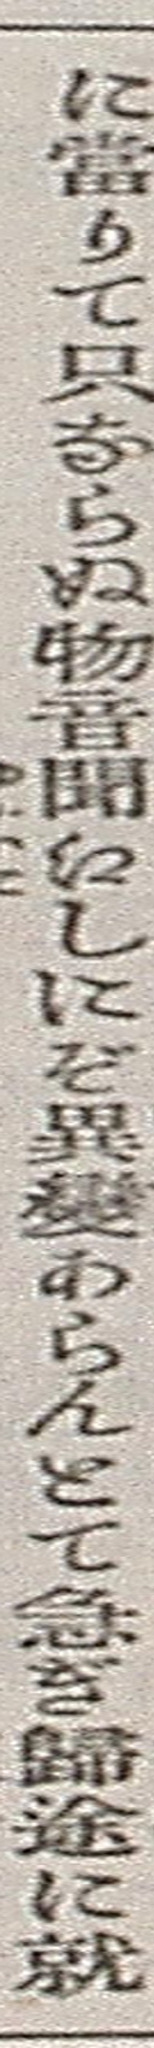に当りて只ならぬ物音聞えしにぞ異変あらんとて急ぎ帰途に就
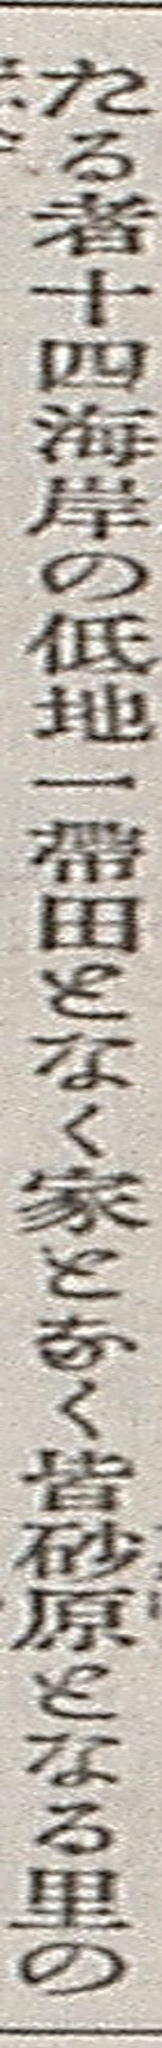たる者十四海岸の低地一帯田となく家となく皆砂原となる里の
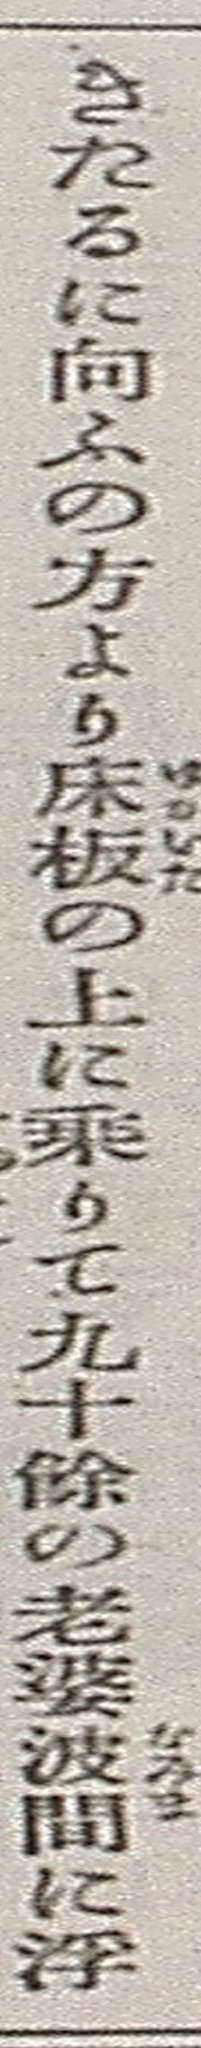きたるに向ふの方より床板の上に乗りて九十余の老婆波間に浮
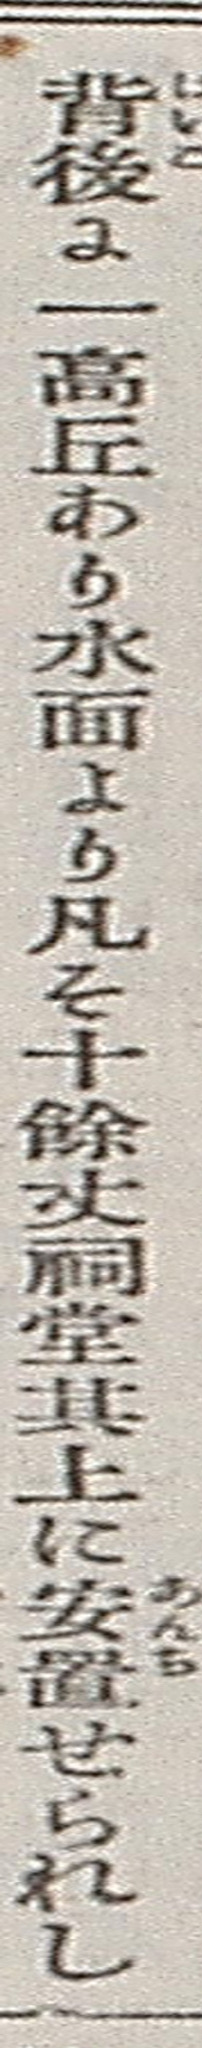背後に一高丘あり水面より凡そ十余丈祠堂其上に安置せられし
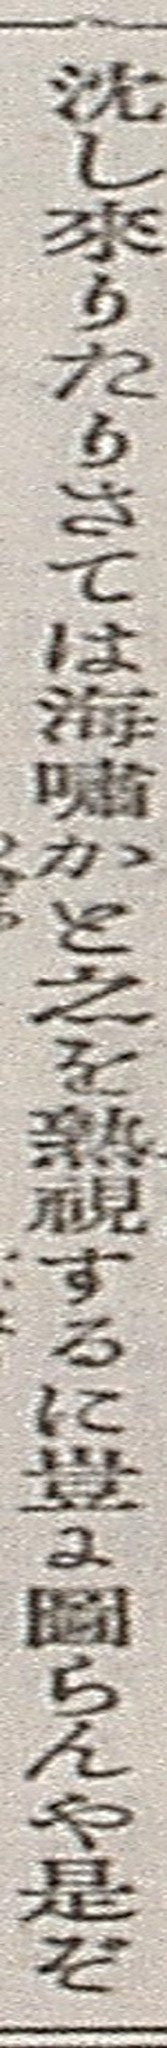沈し来りたりさては海嘯かと之を熟視するに豈に図らんや是ぞ
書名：風俗畫報臨時増刊第百十九號　大海嘯被害録（中）
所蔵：東京大学地震研究所図書室 Earthquake Research Institute Library, The University of Tokyo, JAPAN
